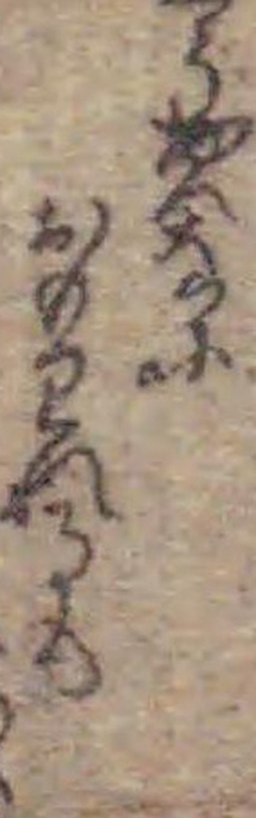おもわれるも
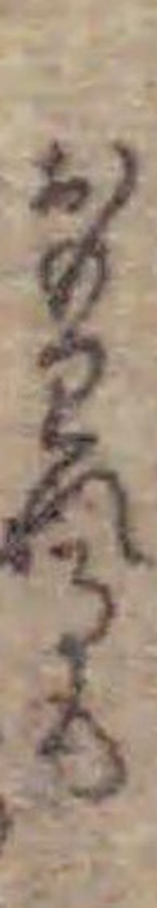おもわれるも
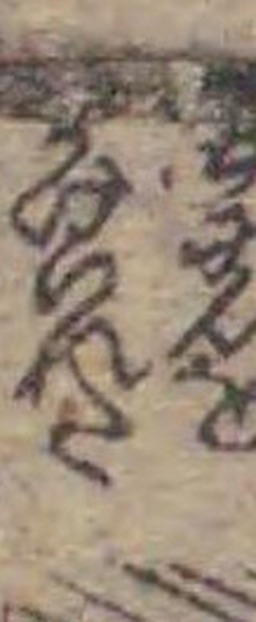かけられた
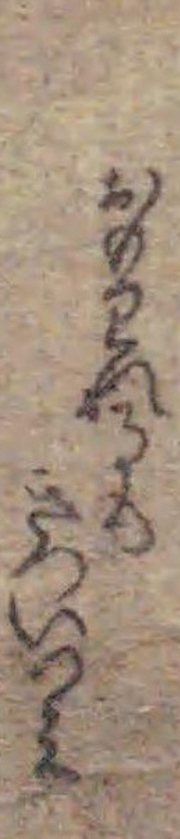おもわれるも
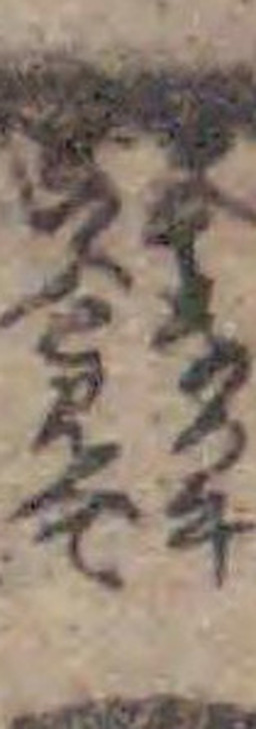といふと見へて
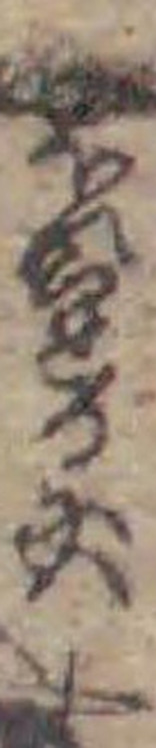ほれられるには
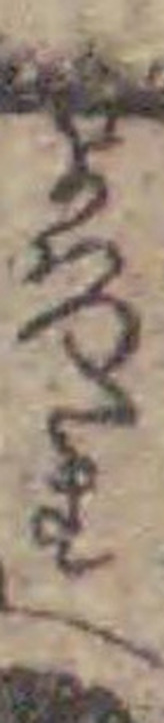よはつたす
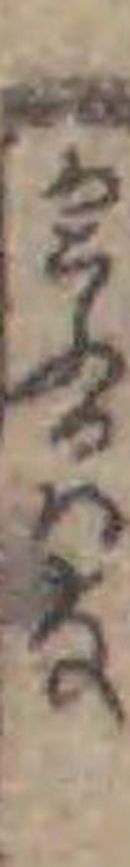かとふるはな

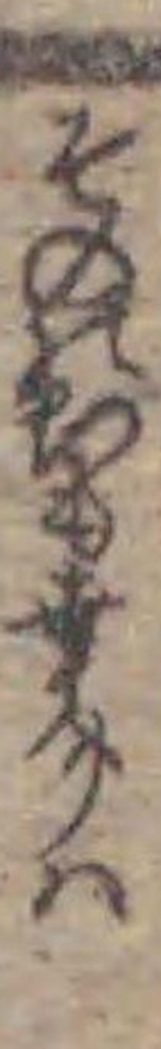そののちも幸介は
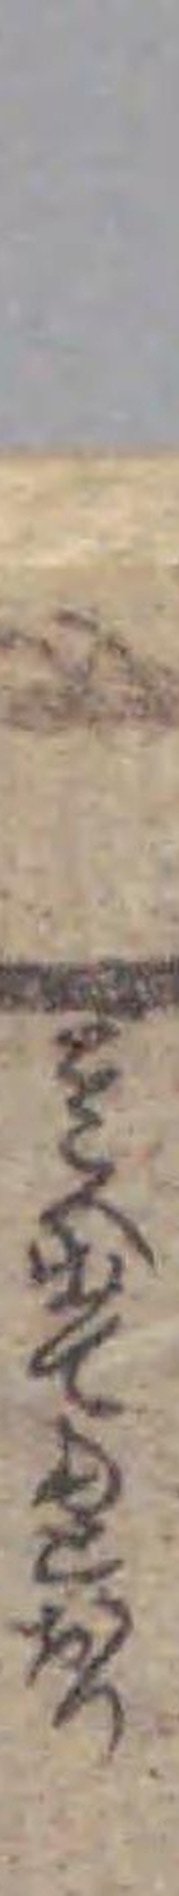とこへ出てもとおり
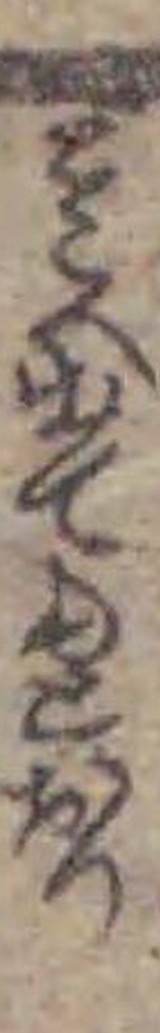とこへ出てもとおり
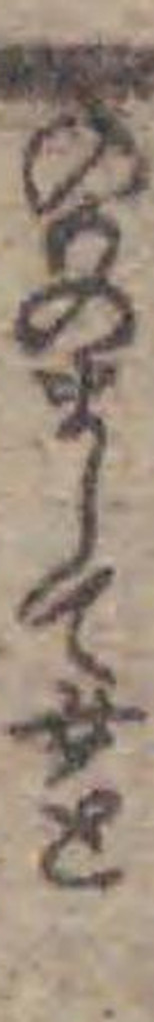のものまして女と
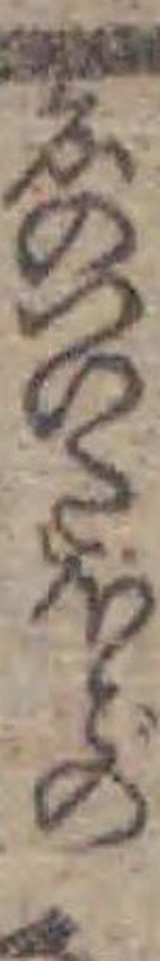名のついたほどの
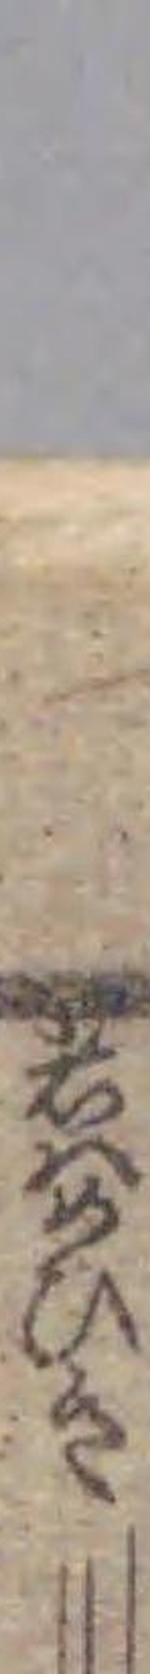者はめひき
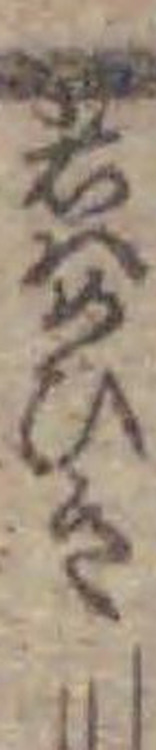者はめひき
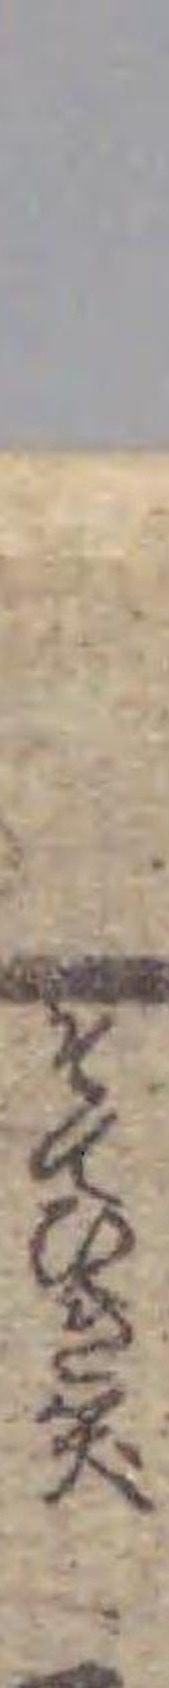そてひき笑
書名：通風伊勢物語 : 3巻
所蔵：国立国会図書館 National Diet Library, JAPAN
